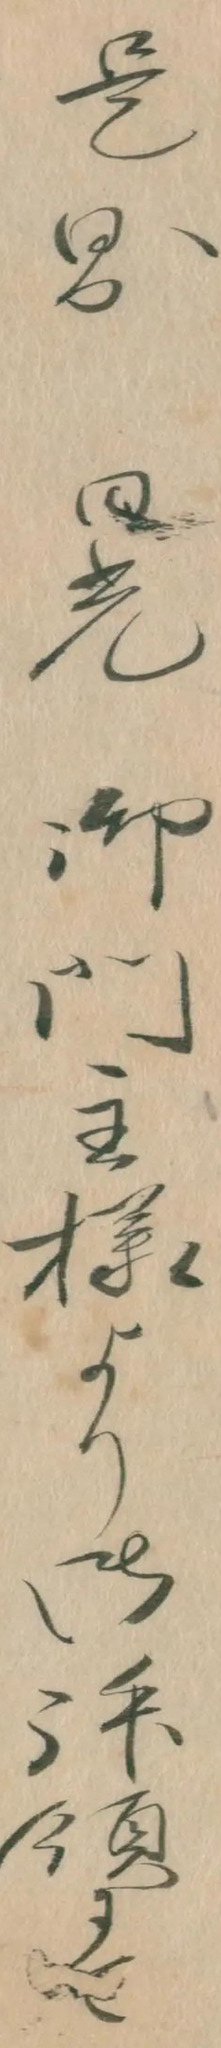是則日光御門主様より御拝領にて
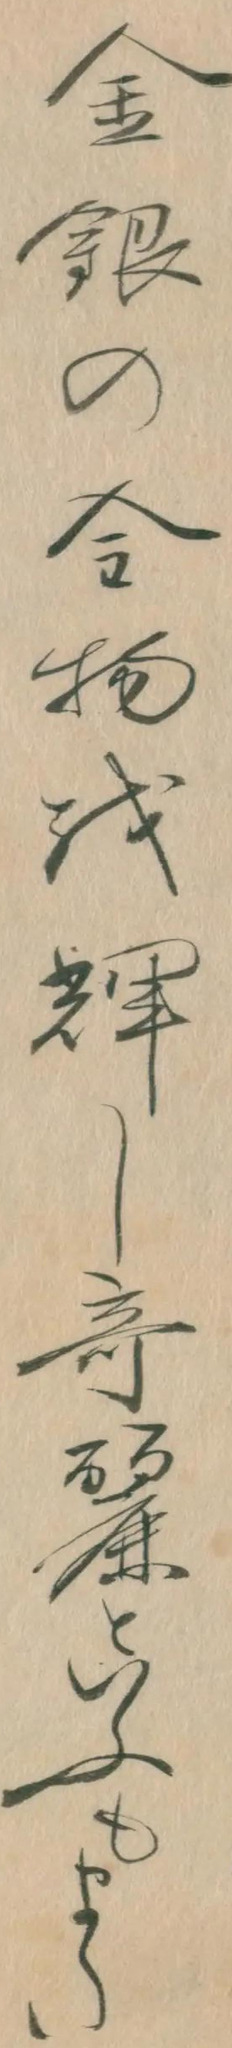金銀の金物を輝し竒麗といふもまた
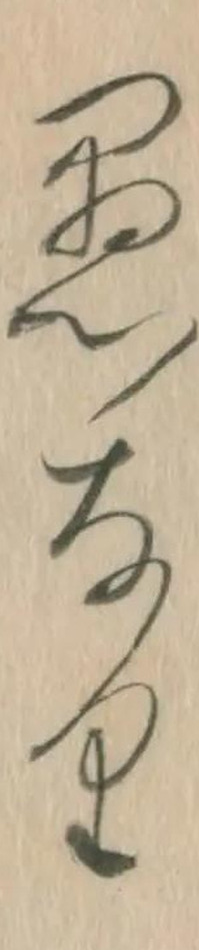愚なり
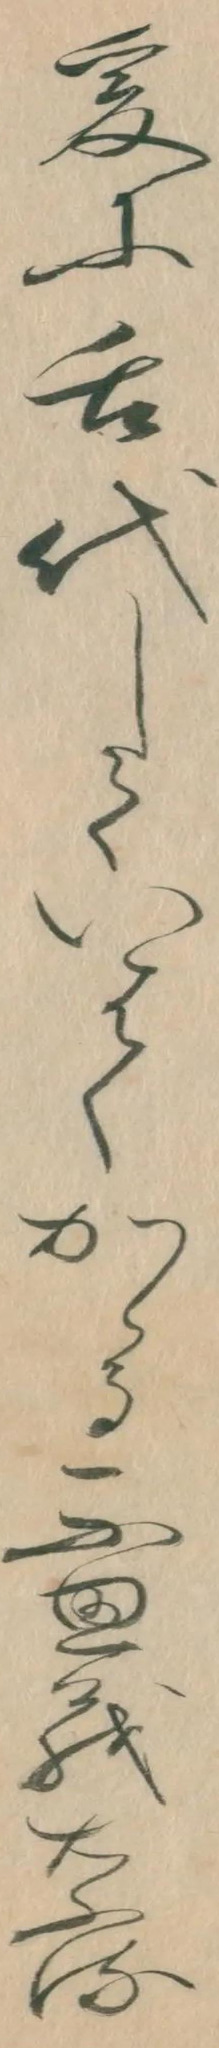爰に舌代していはくかゝる不思議なる
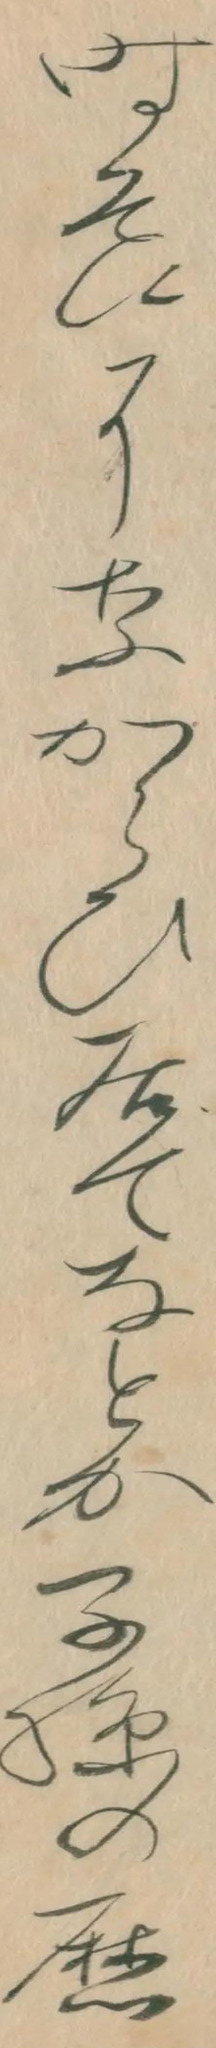時節になからひ居てなとか子孫の歴
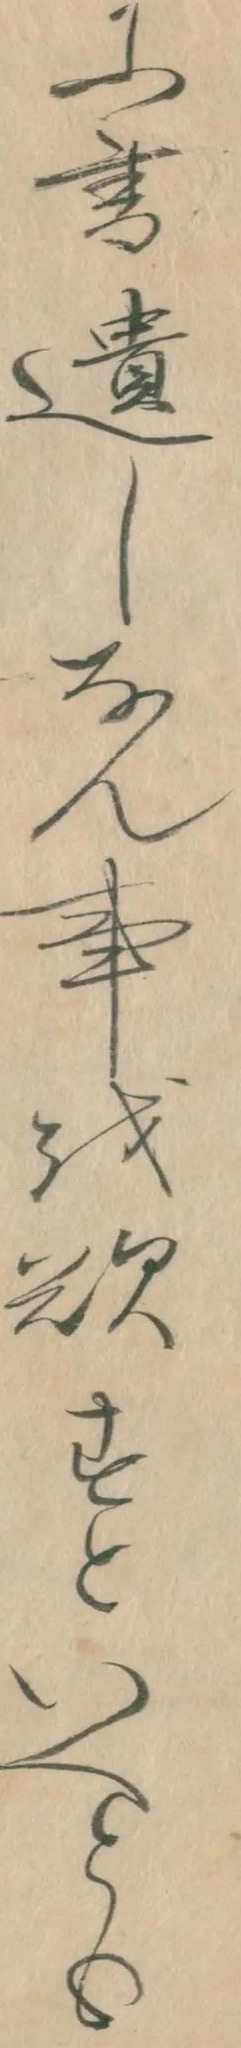に書遺しなん事を欲すといへとも
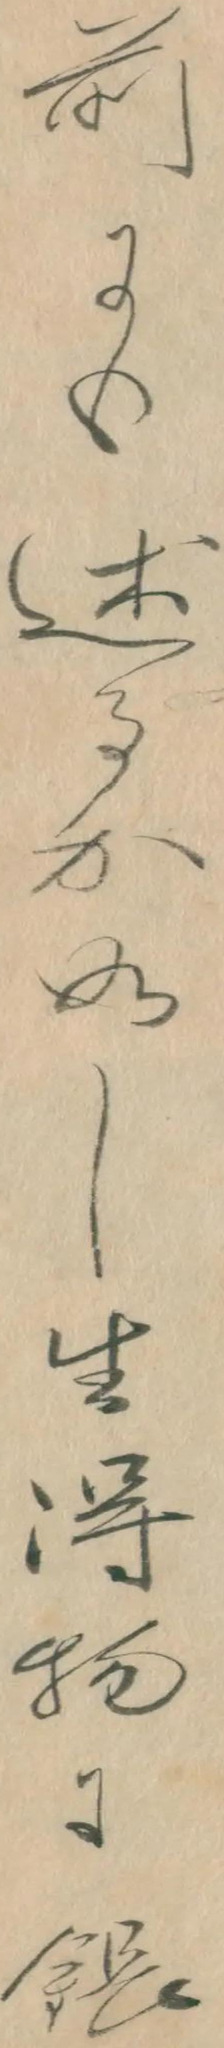前にも述るか如し生得物に銀

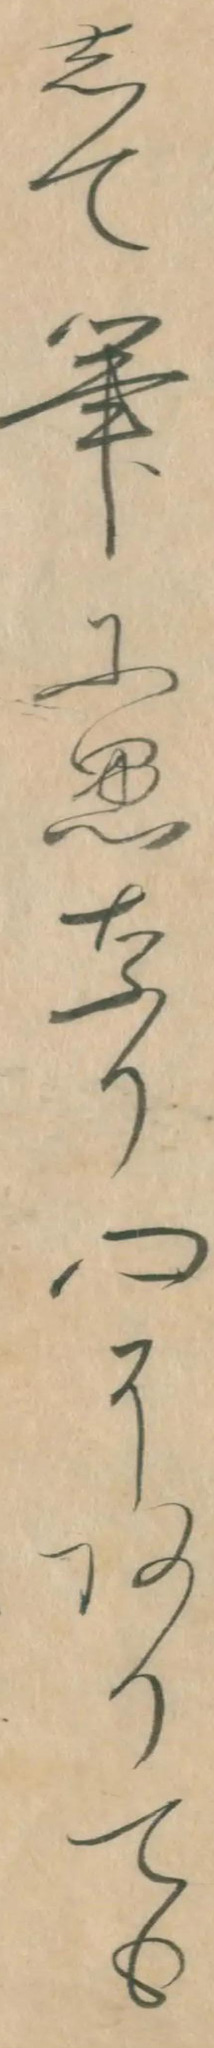して筆に愚なり口にありても
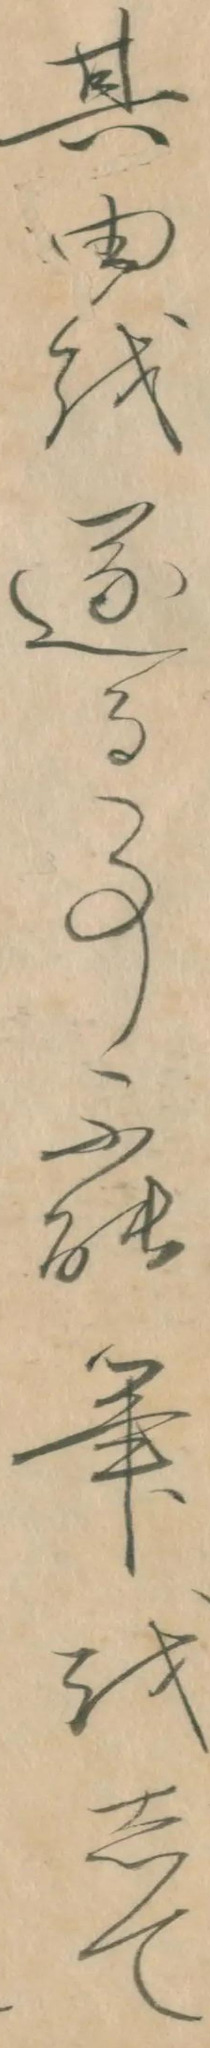其由を遂る事不能筆をして
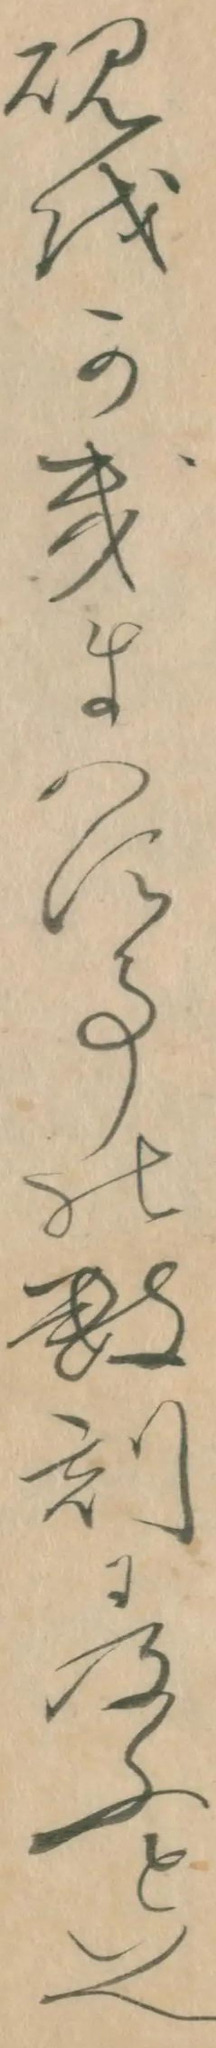硯をかきまはす事の数刻に及ふといへ
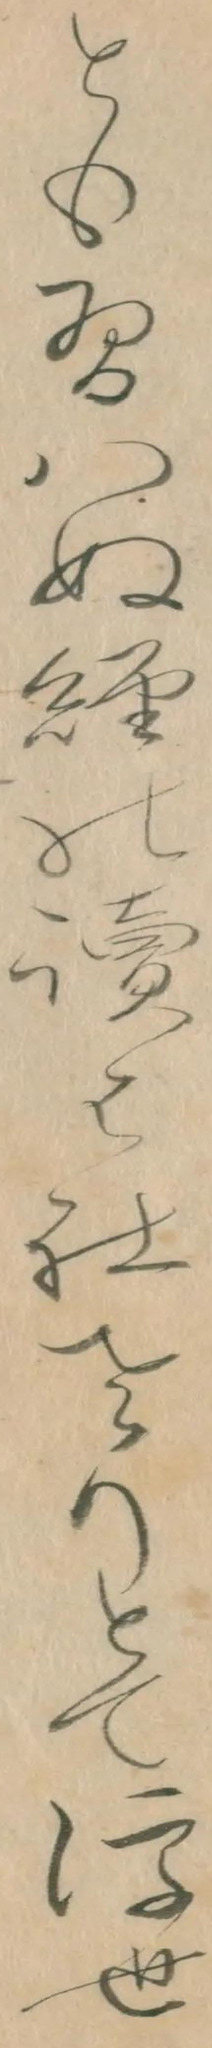とも習はぬ経の読は社さりとて浮世
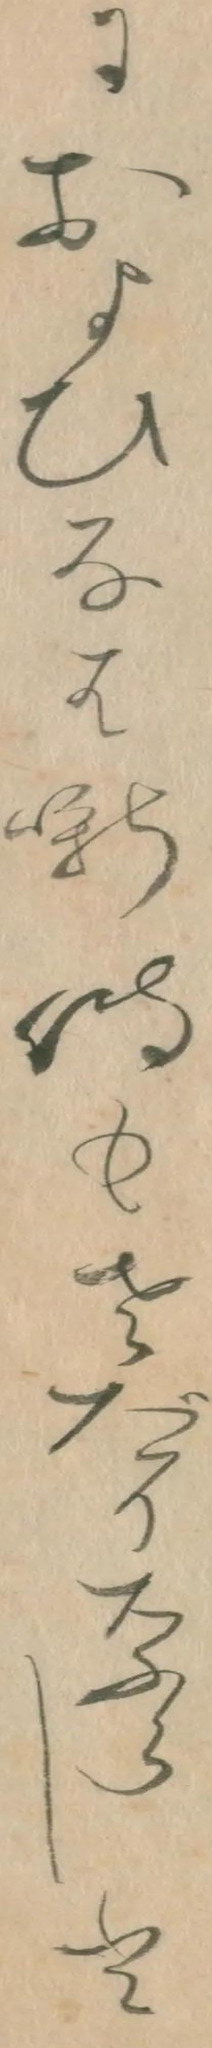におよひなは噺伝もさだかならしと
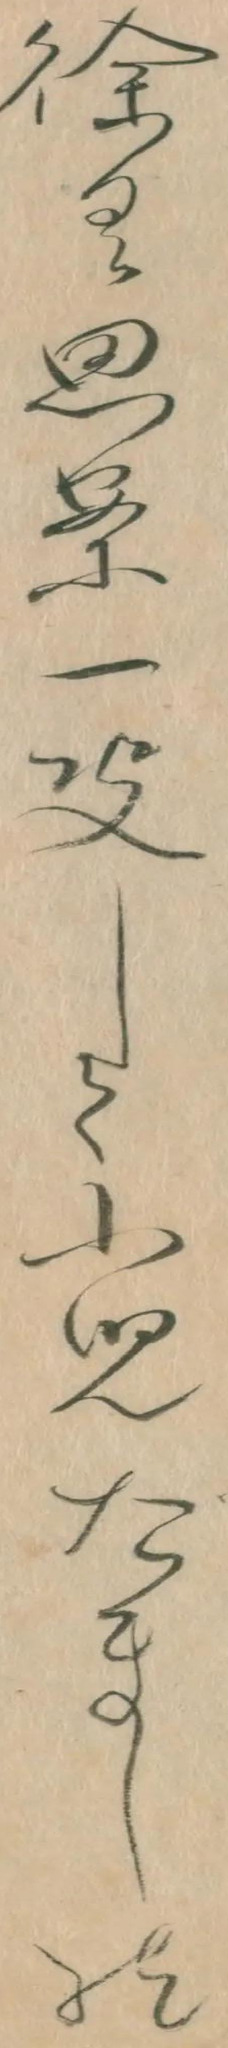徐く思案一決して小児だましの
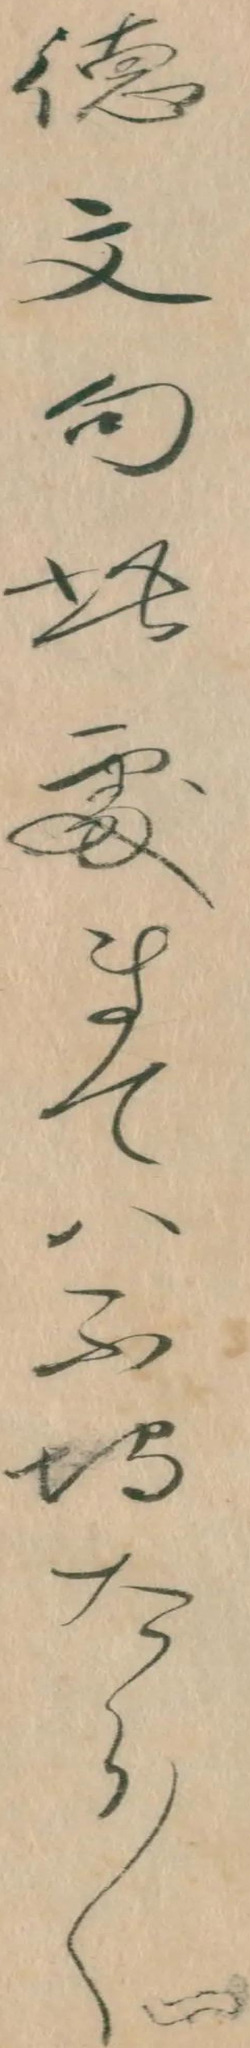徳文句此處まては不埒たら〳〵
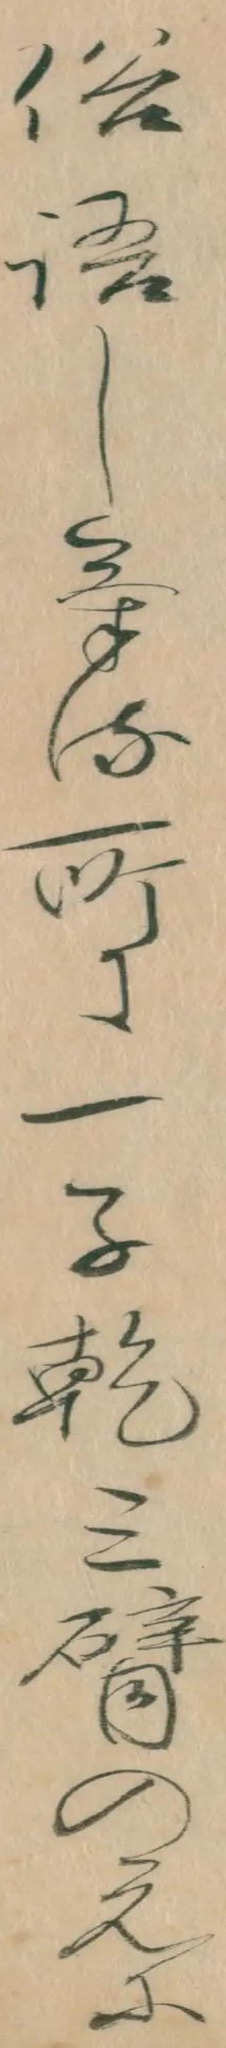俗語しける所に一子乾三臂の元に
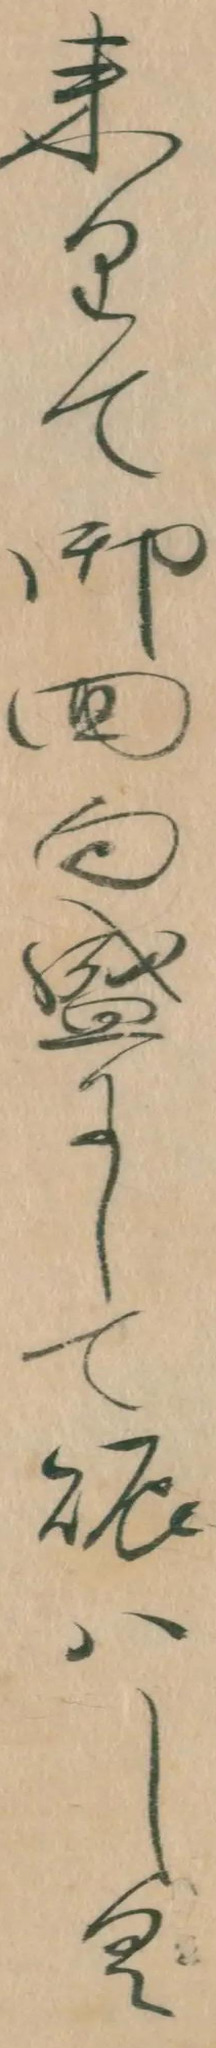来りて御回向盛にして賑はしく
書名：俗語之種. [2]
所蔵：国立国会図書館 National Diet Library, JAPAN
